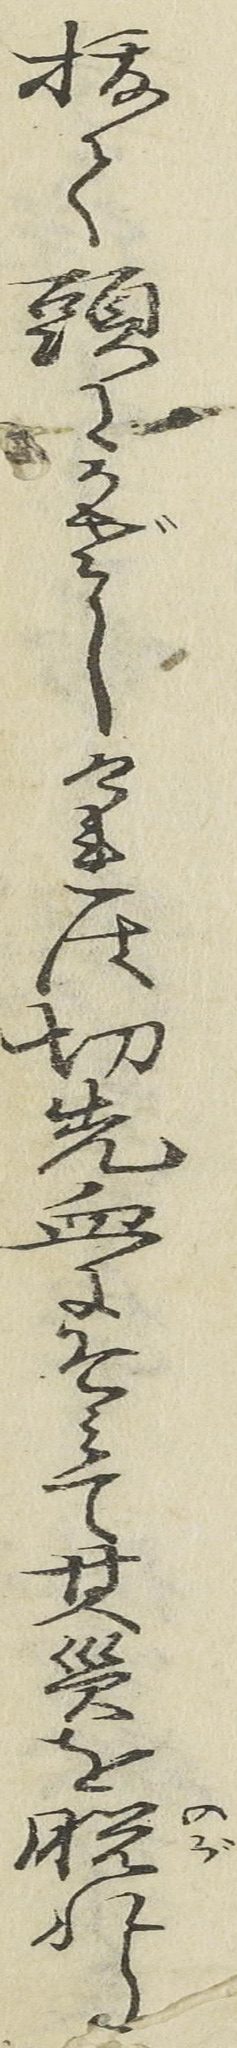抜て頭にかざしけれは切先血にそみて其災を脱れし

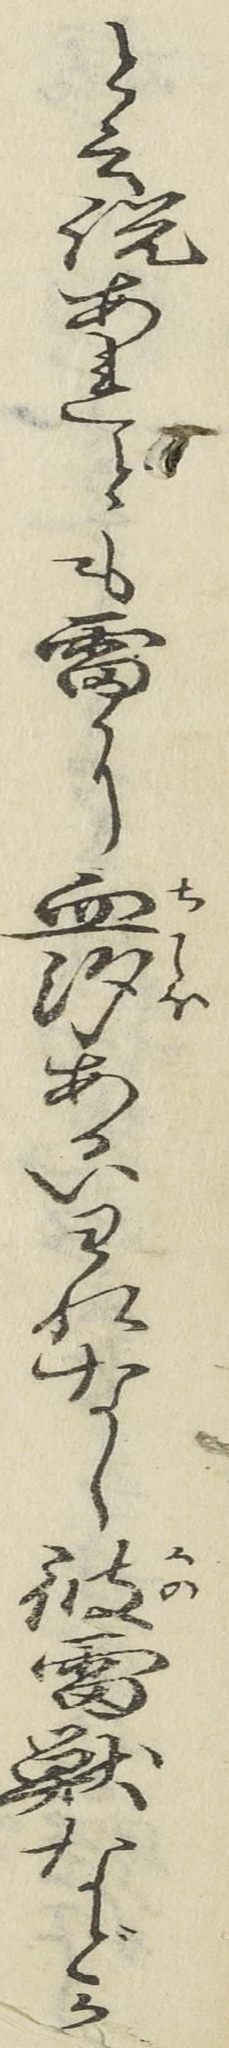と云説ありとも雷に血汐あるいわれなし彼雷獣などか
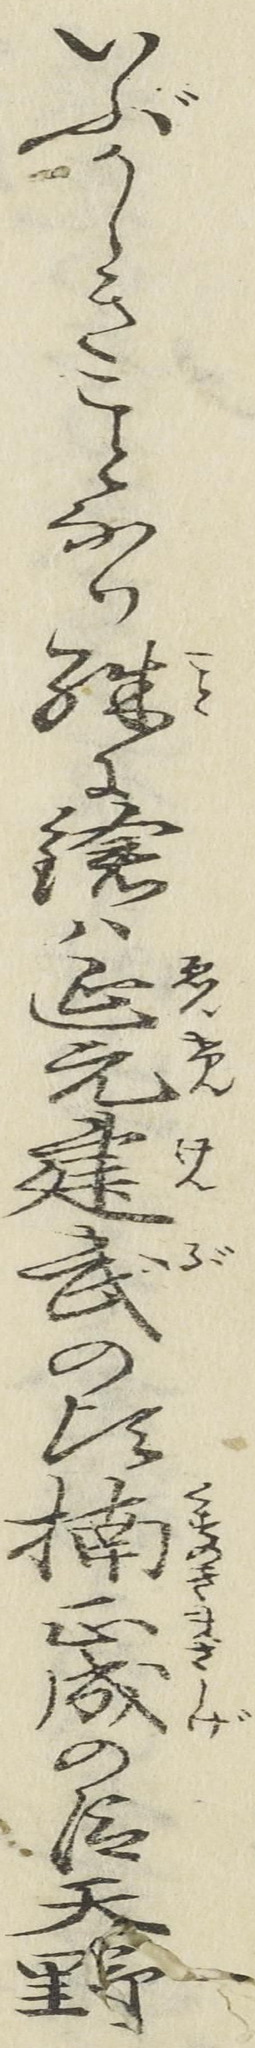いぶかしきことなり殊に鎗は延元建武の頃楠正成の臣天野
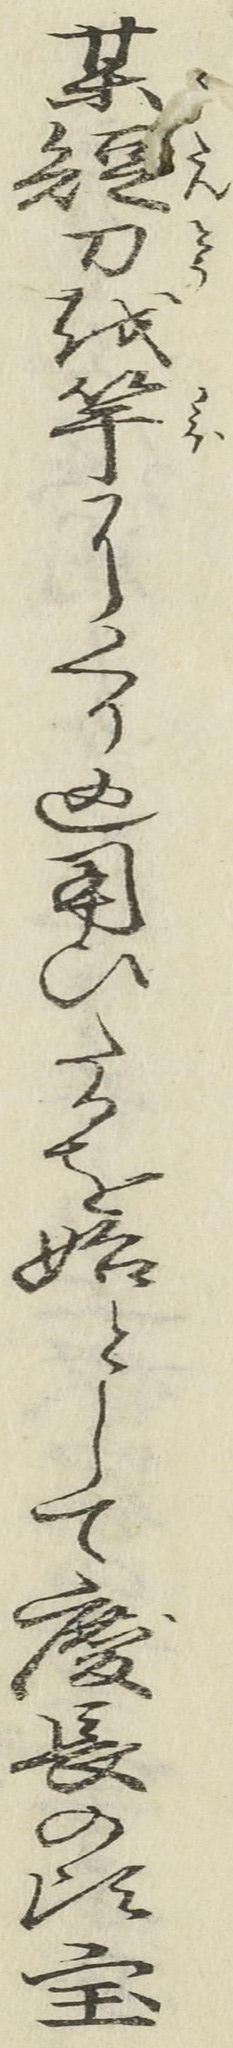某短刀を竿にくり込用ひたるを始として慶長の頃宝
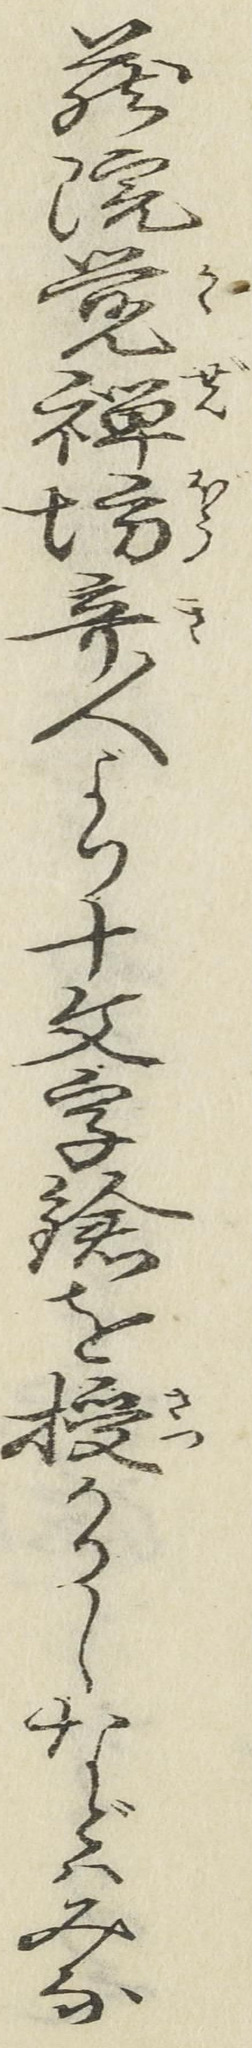蔵院覚禅坊貴？人より十文字鎗を授かりしなどはみな
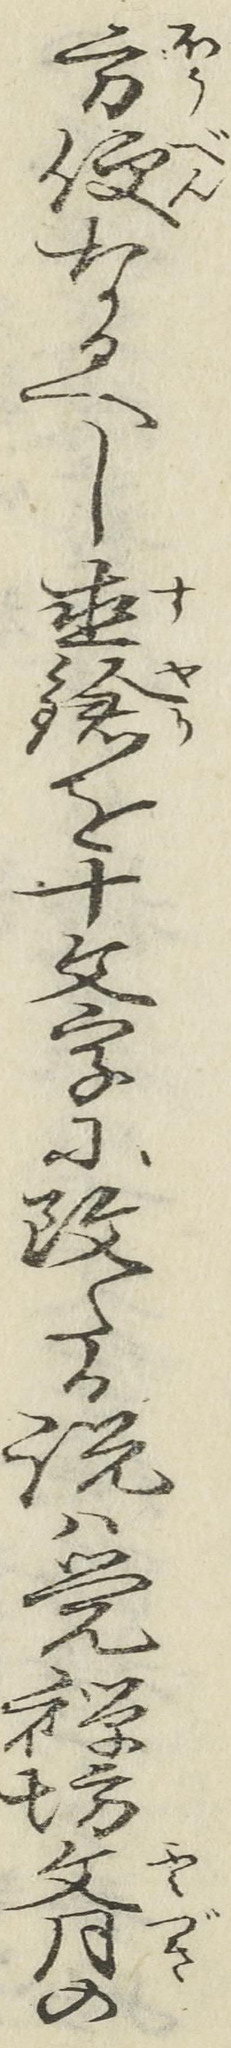方便なるへし直鎗を十文字に改たり説は覚禅棒文月の
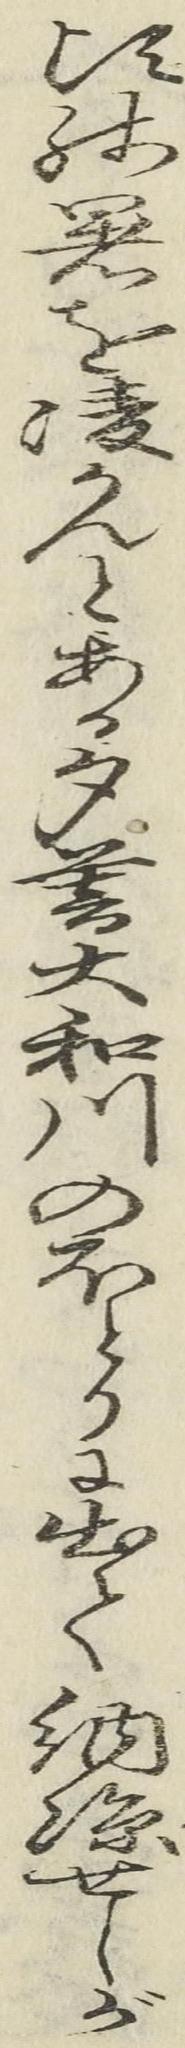頃残暑を凌かんとある夕暮大和川のほとりに出て納涼せしが
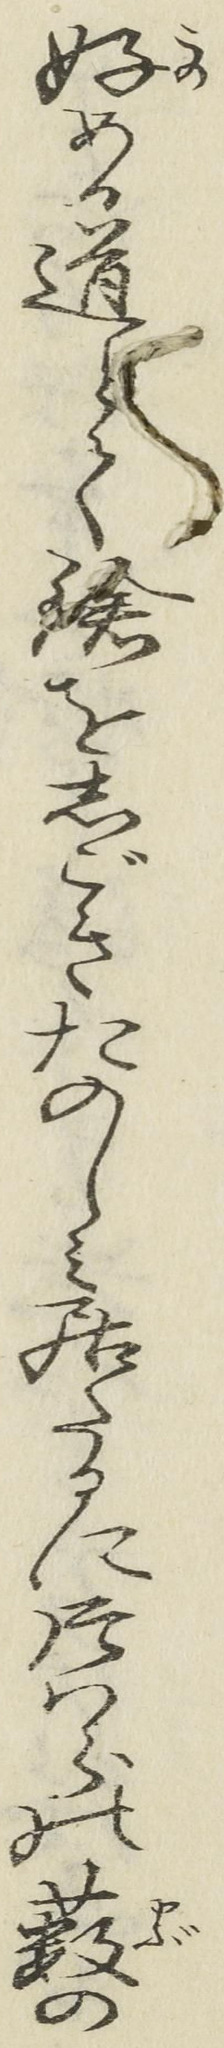好める道とて槍をしごきたのしみ居たるに片はらの藪の
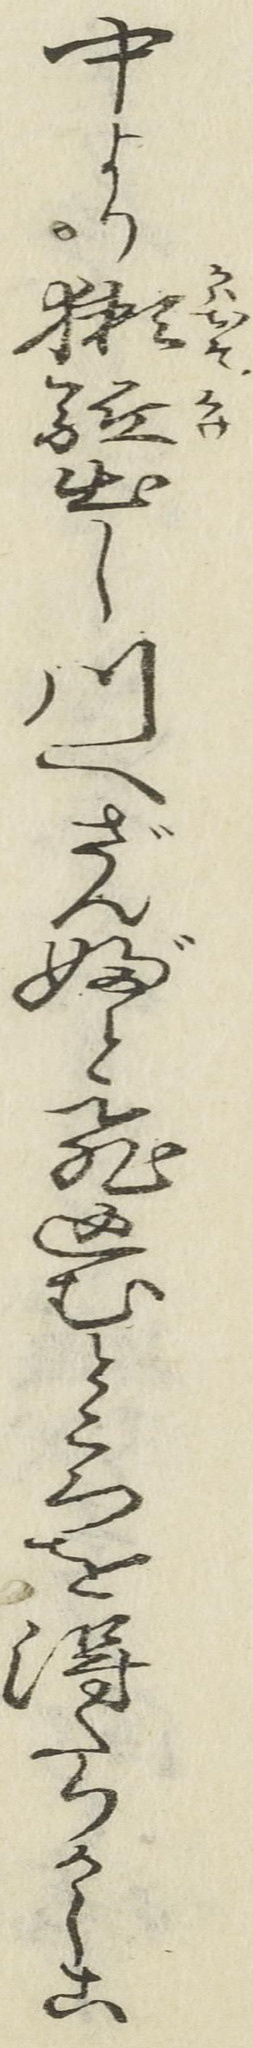中より獺駈出し川へざんぶと飛込むところを得たりかしこ
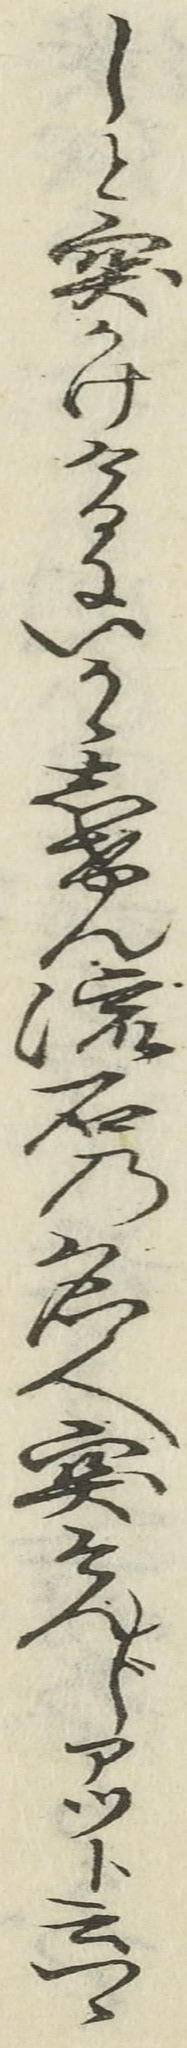しと突かけけるにいかゝしけむ流石の名人突そんじアツト云いつゝ
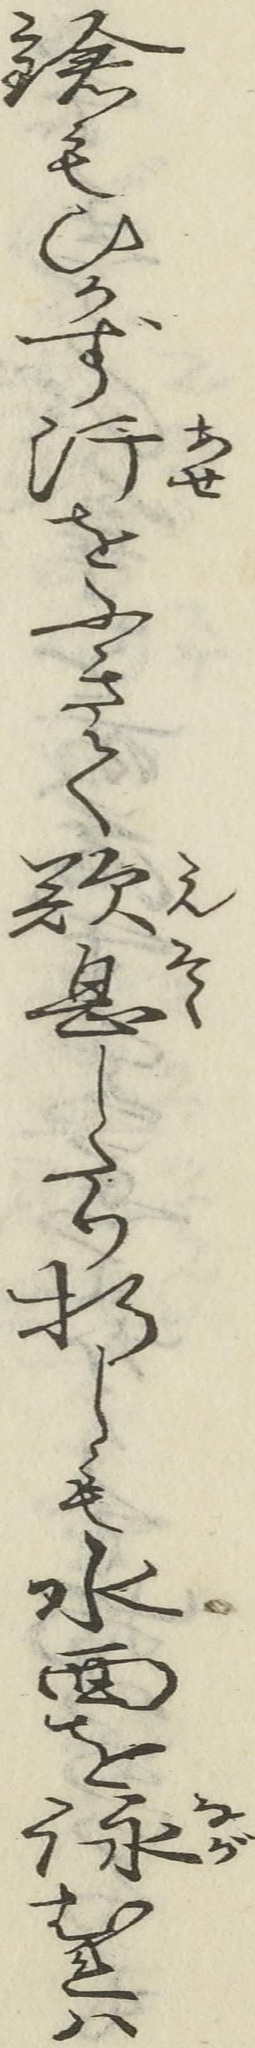鎗もひかず汗をふきて嘆息したり折しも水面を詠むれは
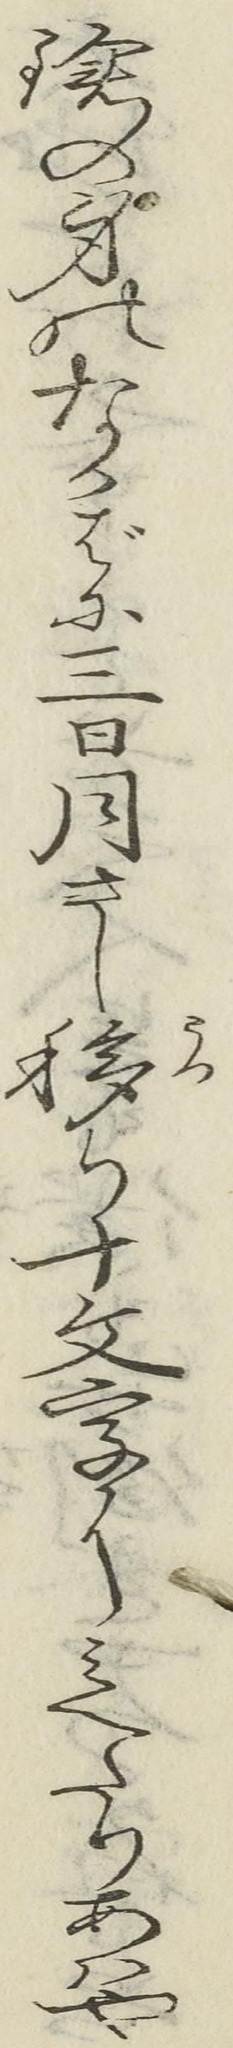鎗の身のなかばに三日月さし移り十文字にみへたりあはや
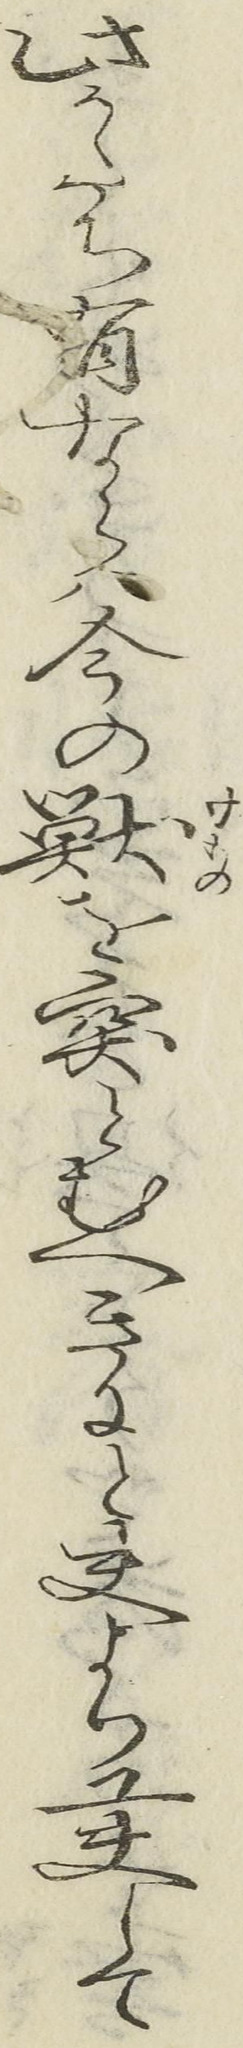此かたち有ならは今の獣を突とむへきにと夫より工夫して
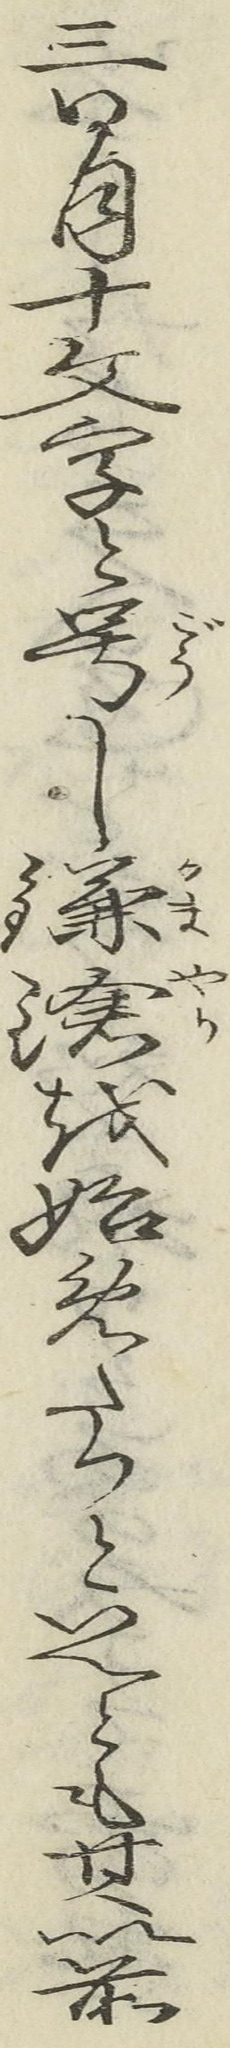三日月十文字と号し鎌鎗を始めたりといへとも其以前
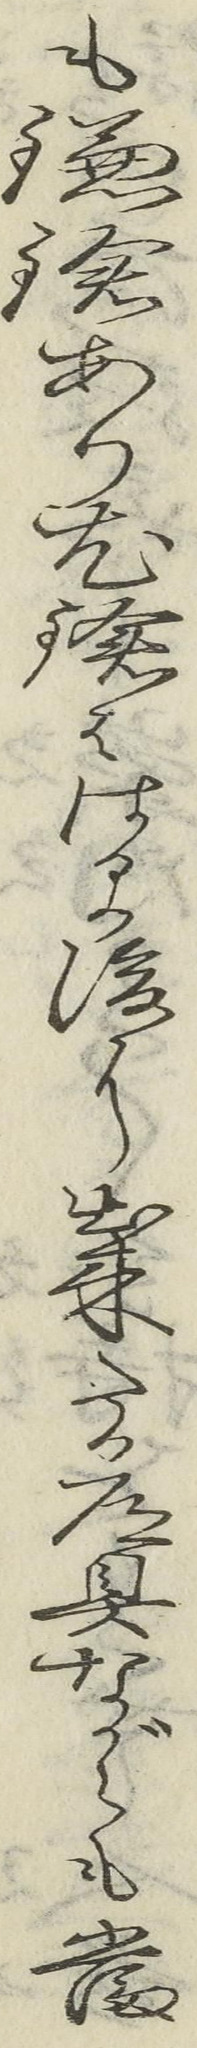も鎌鎗あり最も鎗ははるか後に出来たる道具ながらも當
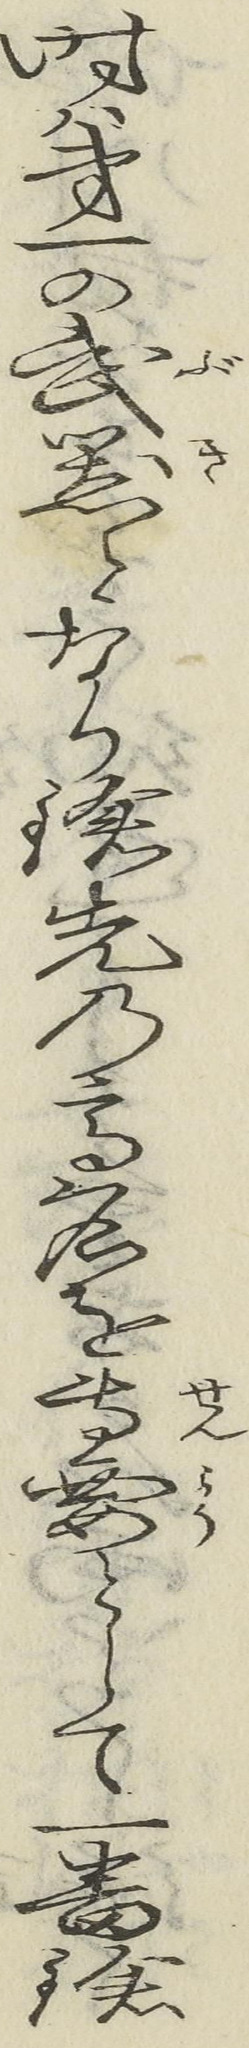時は第一の武器となり鎗先の高名を専要として一番鎗
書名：震雷考説　全
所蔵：東京大学地震研究所図書室 Earthquake Research Institute Library, The University of Tokyo, JAPAN
